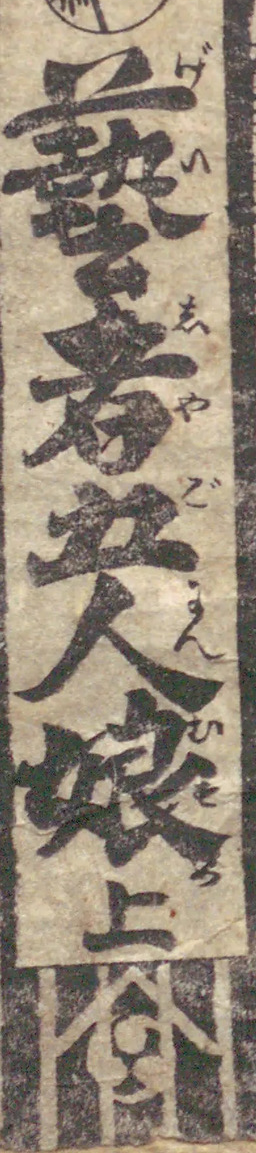藝者五人娘上

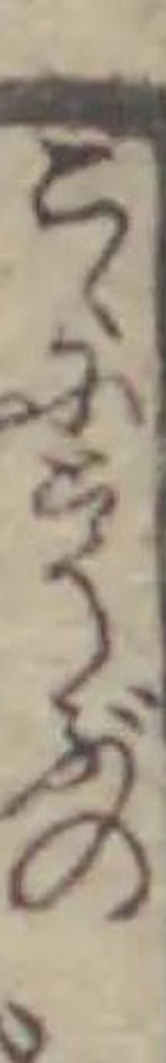こゝにとうぶの
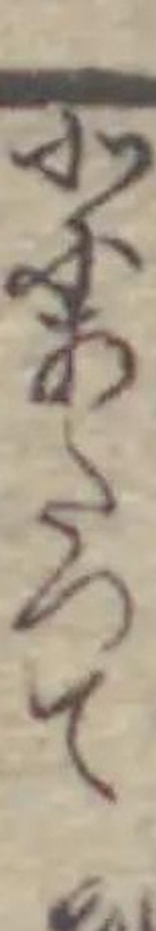北にあたつて
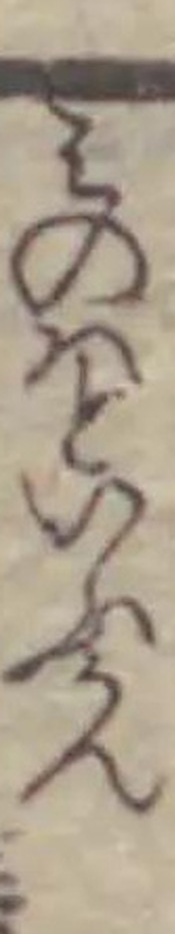みのはといふかん
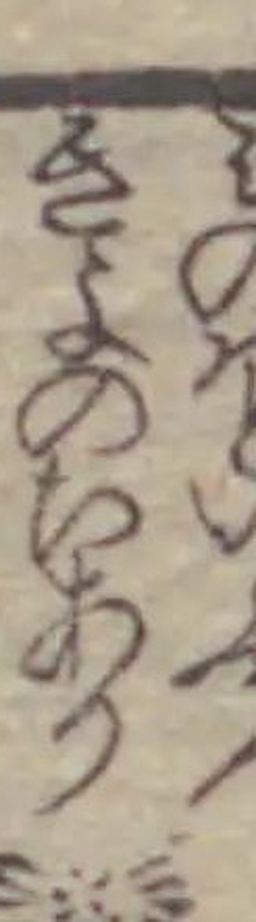きよのちあり
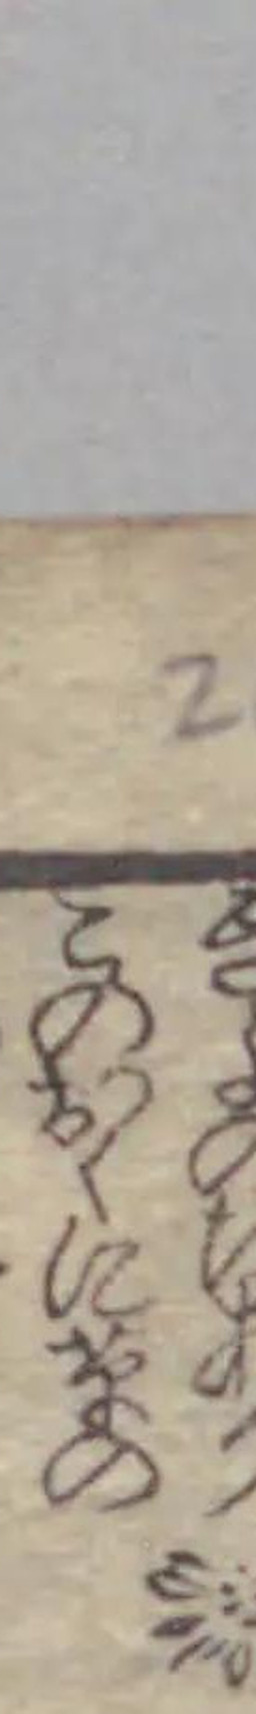このおくに草の
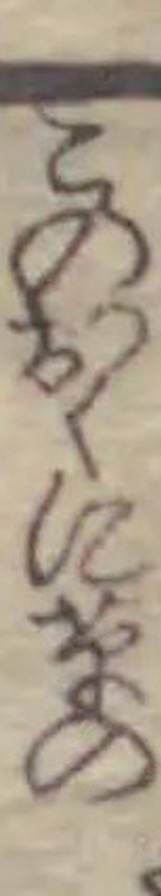このおくに草の
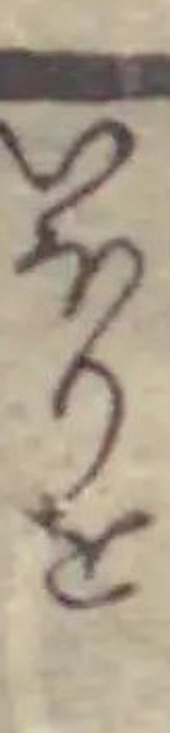いほりを
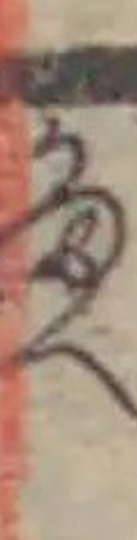かまへ
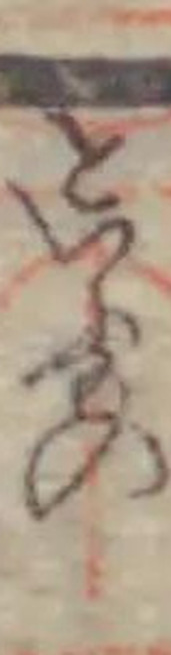といふもの
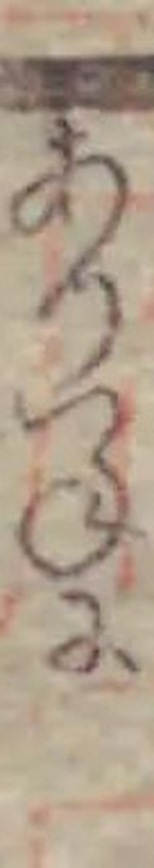ありつねに
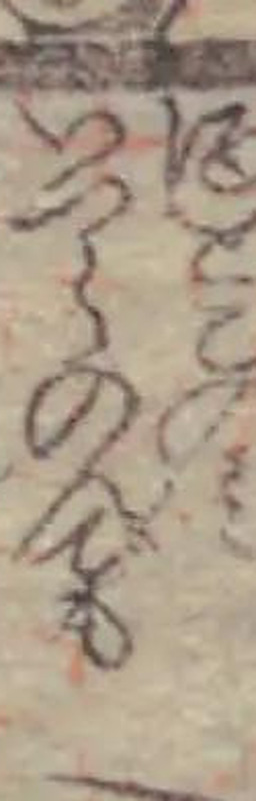いくらのんでも
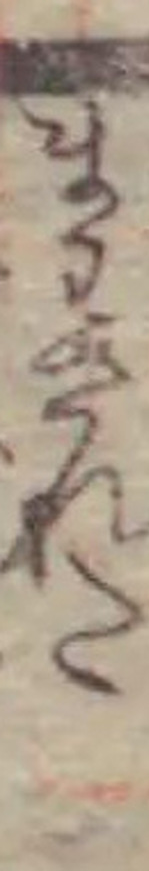まわされた
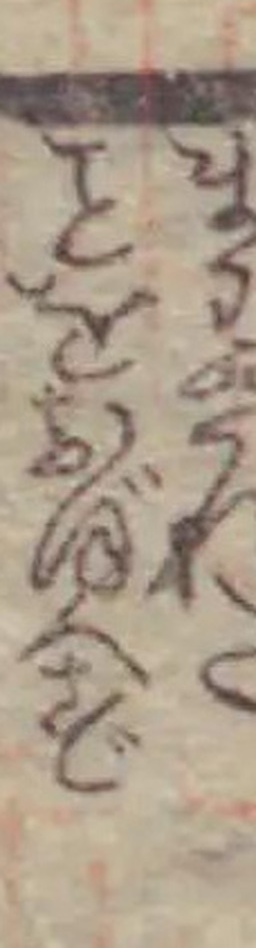ことをおぼへず
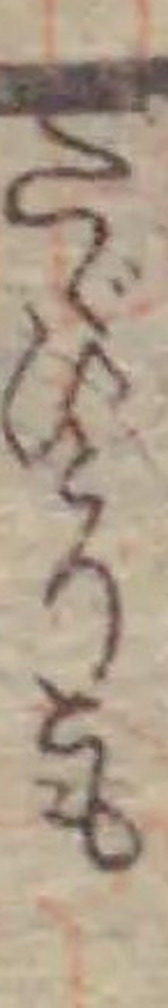ただひとりこも
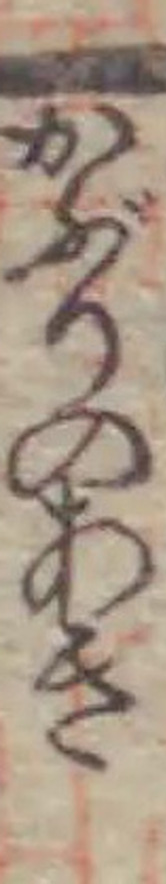かぶりのあき
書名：藝者五人娘 2巻
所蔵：国立国会図書館 National Diet Library, JAPAN
